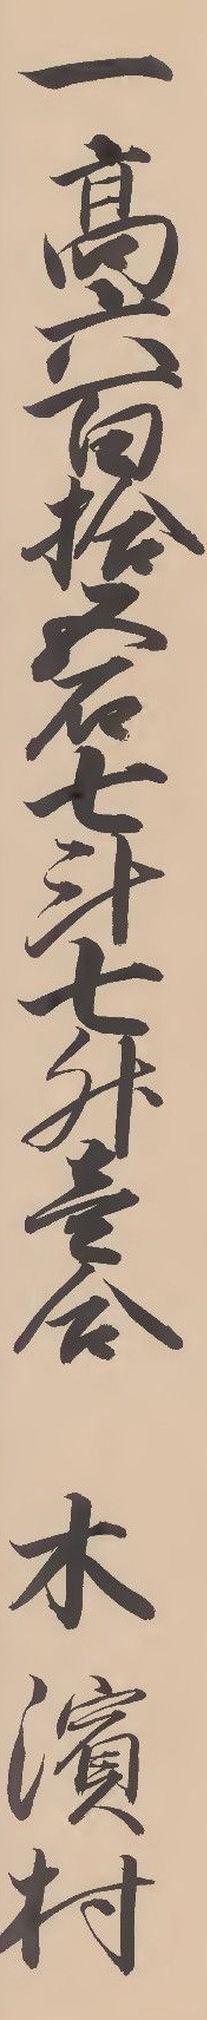一高六百拾五石七斗七升壱合木浜村
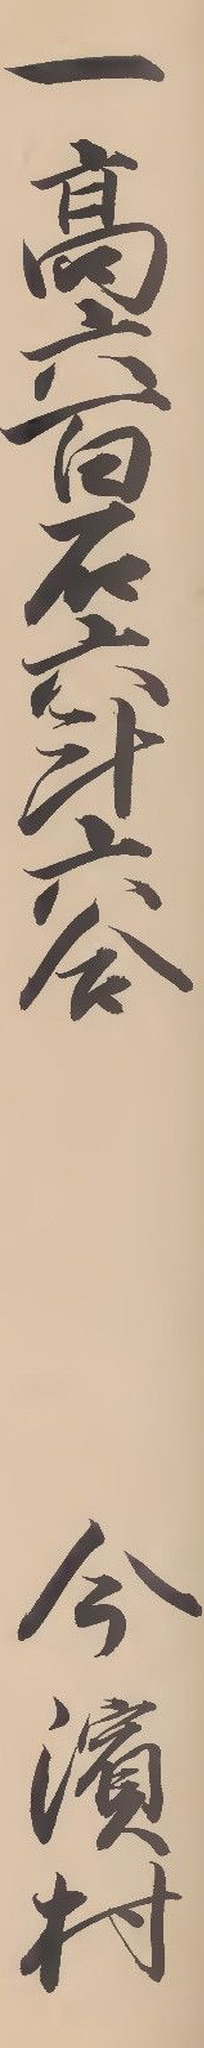一高六百石六斗六合今浜村
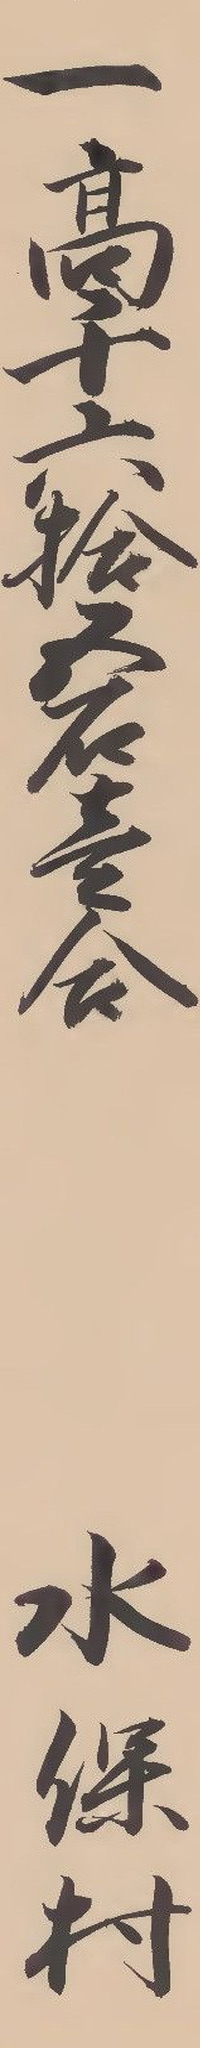一高千六拾五石壱合水保村
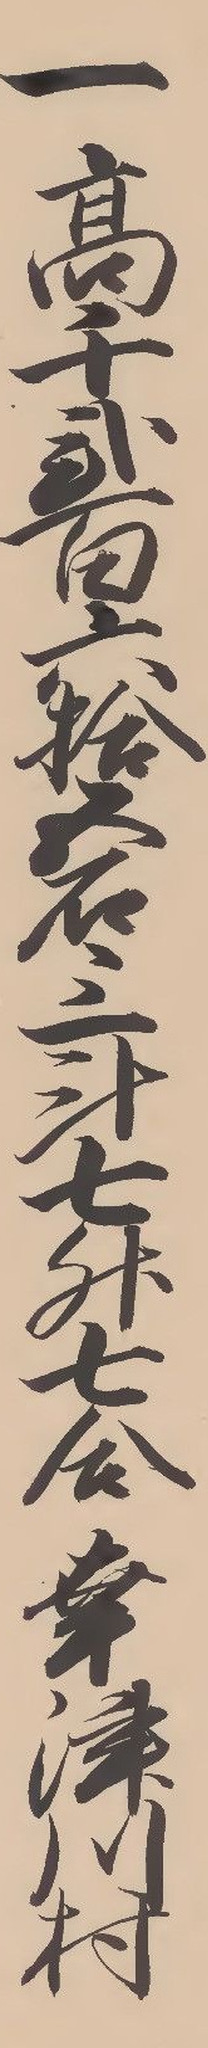一高千弐百六拾五石三斗七升七合幸津川村
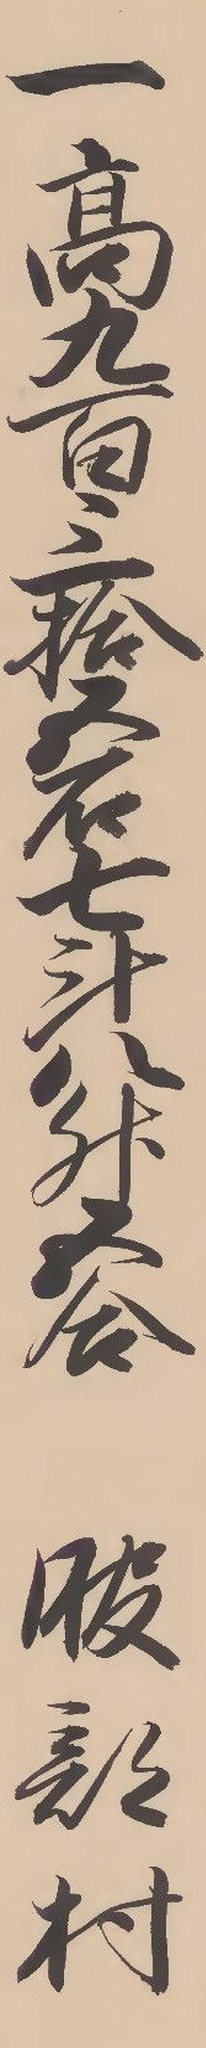一高九百三拾五石七斗八升五合服部村

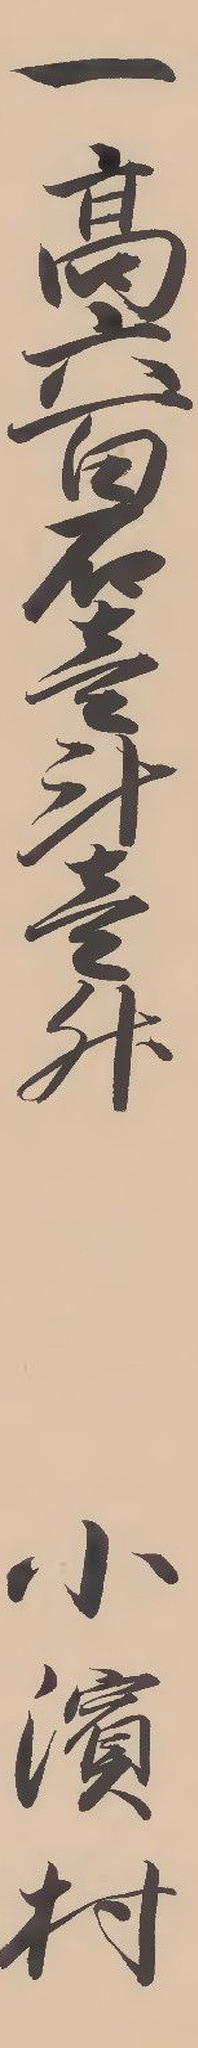一高六百石壱斗壱升小浜村
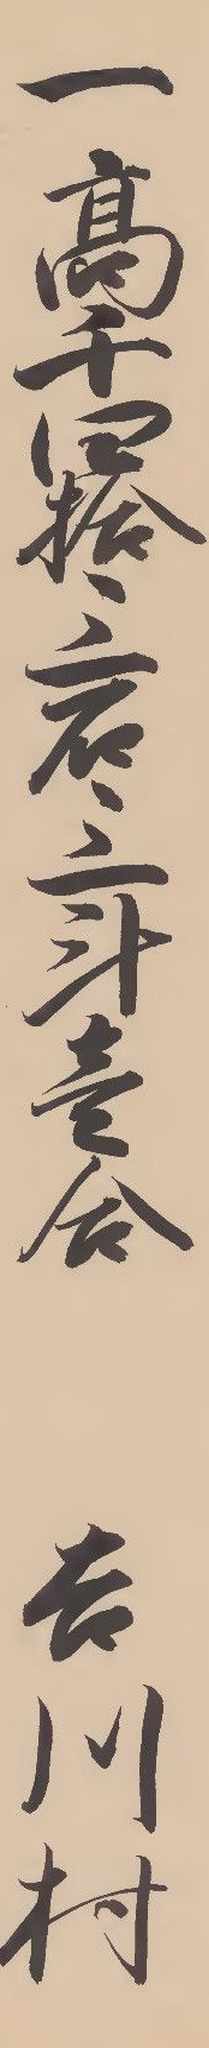一高千四拾三石三斗壱合吉川村
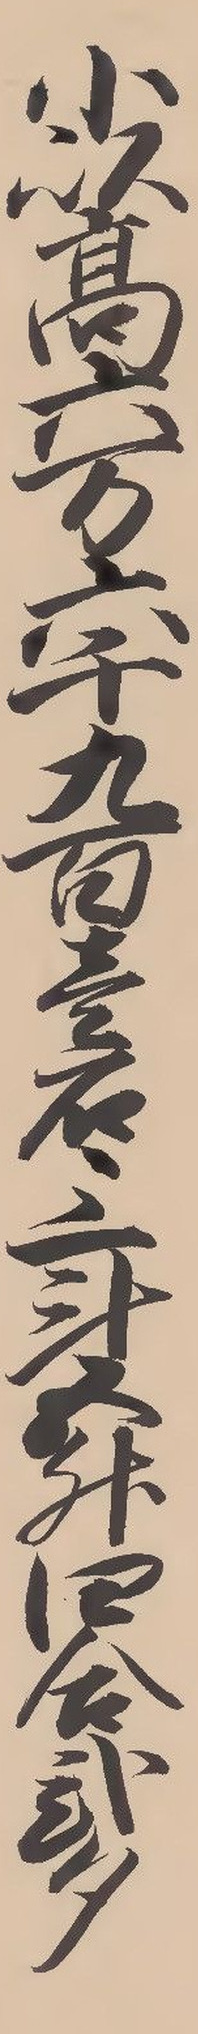小以高六万六千九百壱石三斗五升四合弐勺
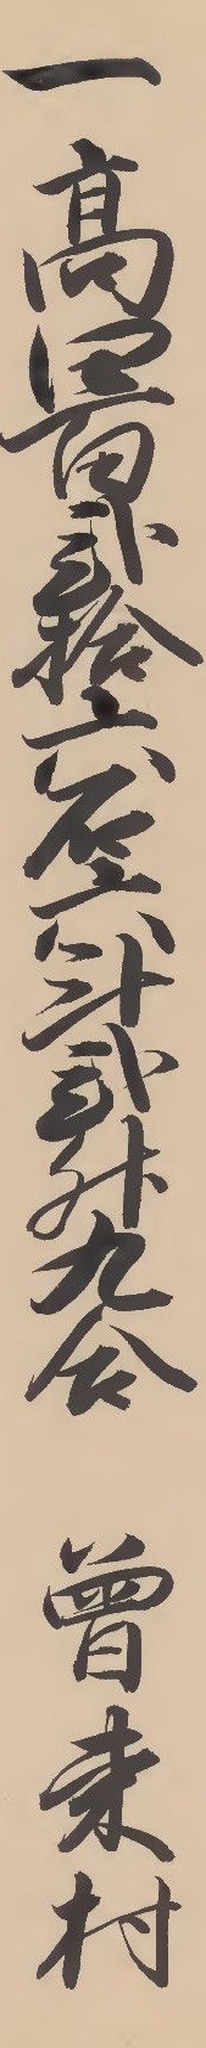一高四百弐拾六石六斗弐升九合曽束村
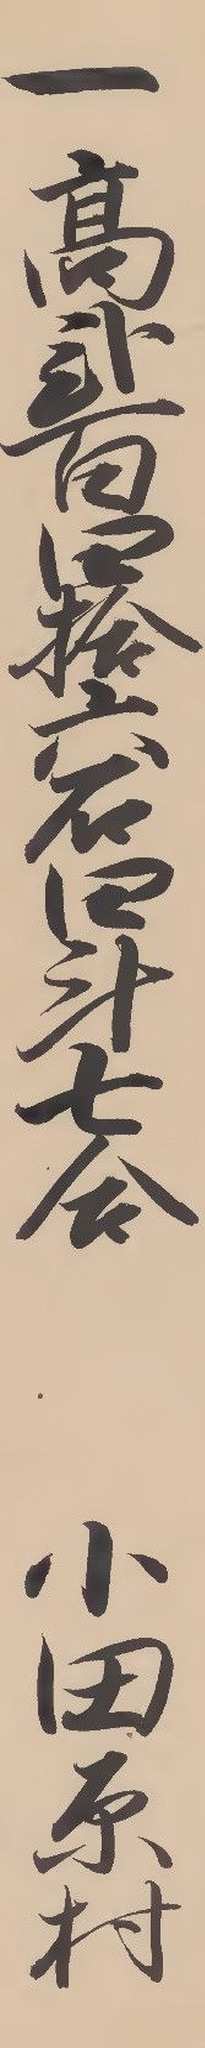一高弐百四拾六石四斗七合小田原村
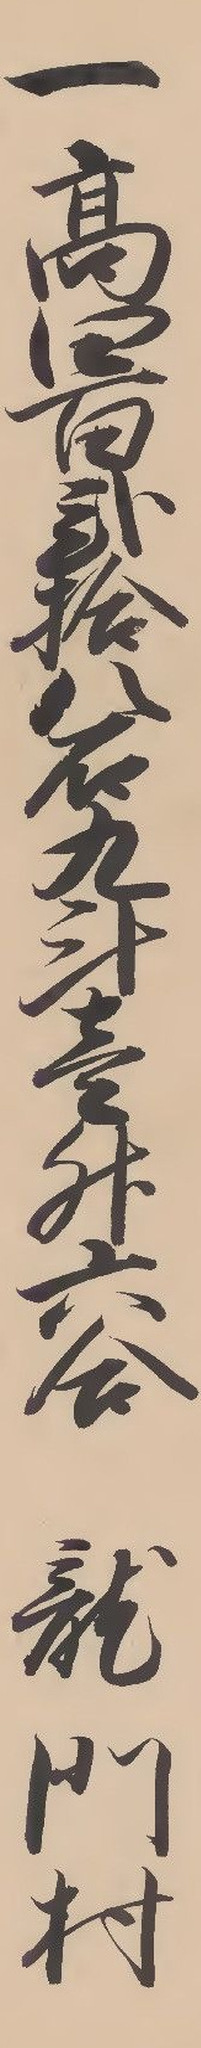一高四百弐拾八石九斗壱升六合竜門村

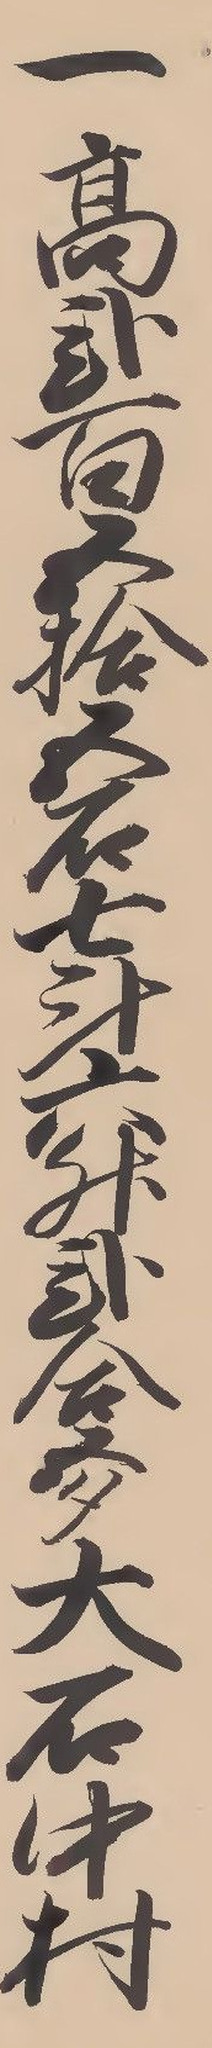一高弐百五拾五石七斗六升弐合五勺大石中村
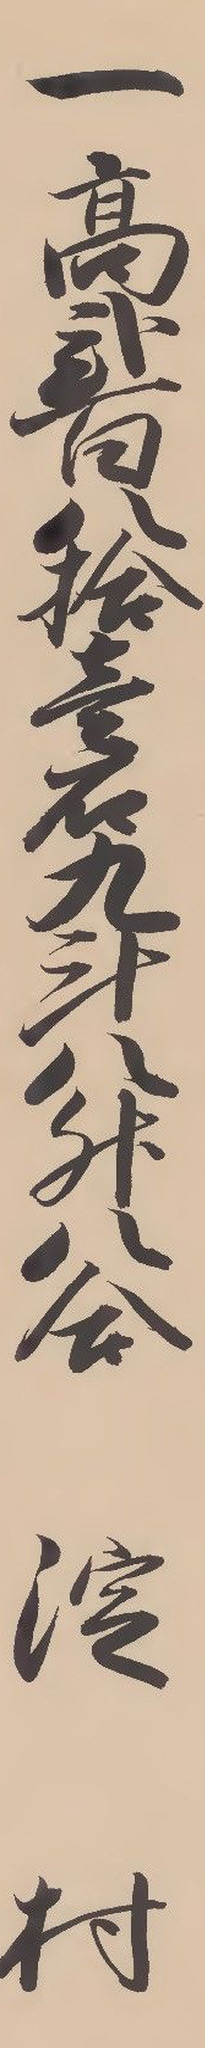一高弐百八拾壱石九斗八升八合淀村
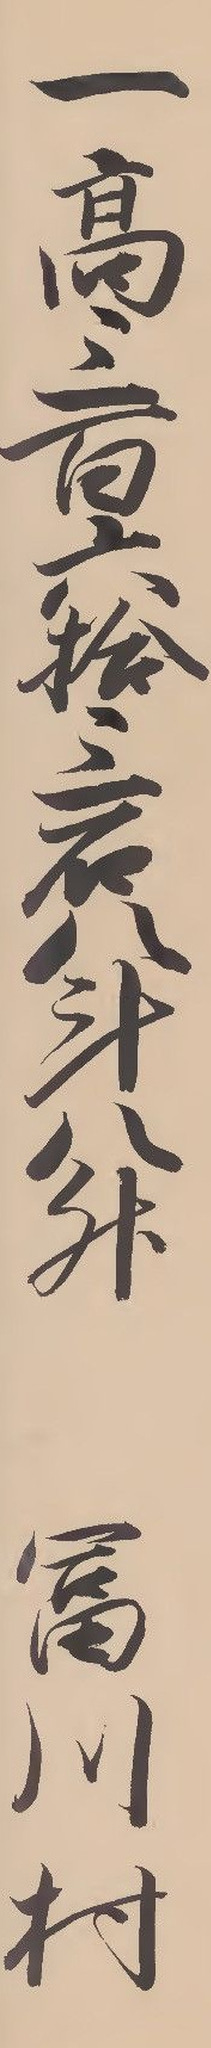一高三百六拾三石八斗八升富川村
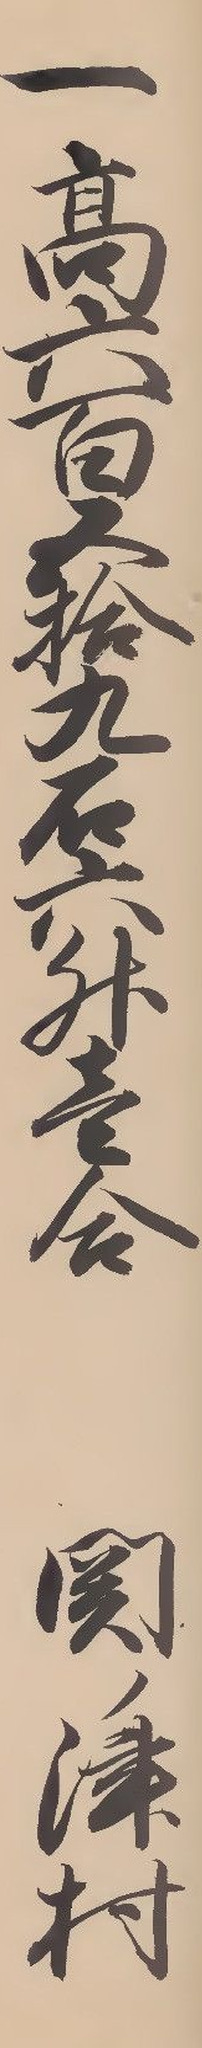一高六百五拾九石六升壱合関ノ津村
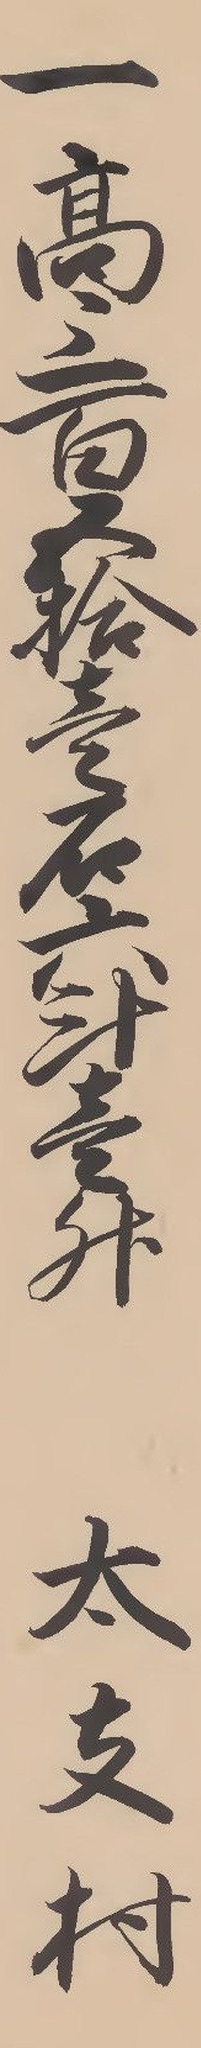一高三百五拾壱石六斗壱升太支村
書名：近江国郷帳
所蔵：国立公文書館 National Archives of Japan
